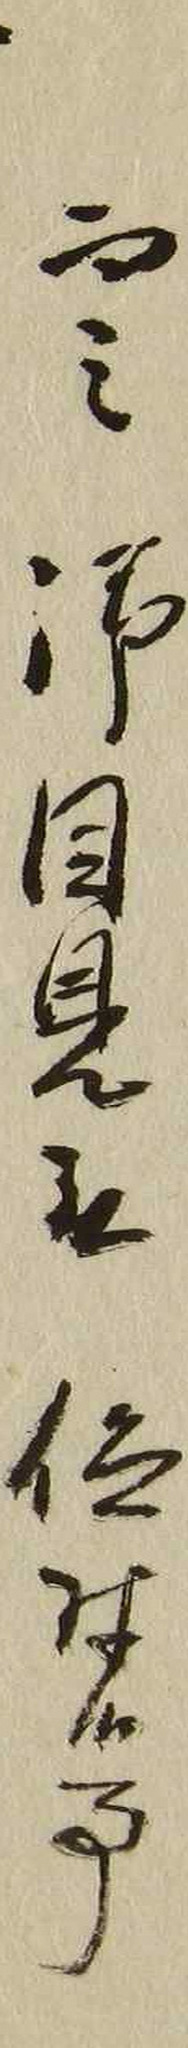而之御目見被仰付候事
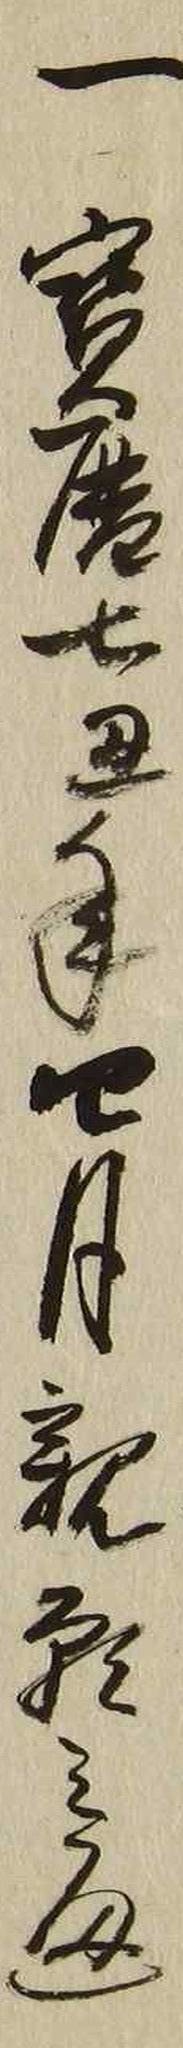一宝暦七丑年四月親願之通
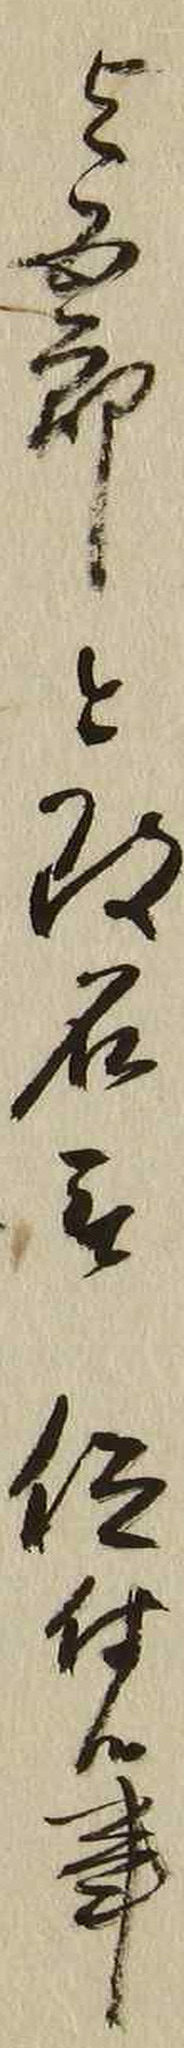与五郎と改名被仰付候事
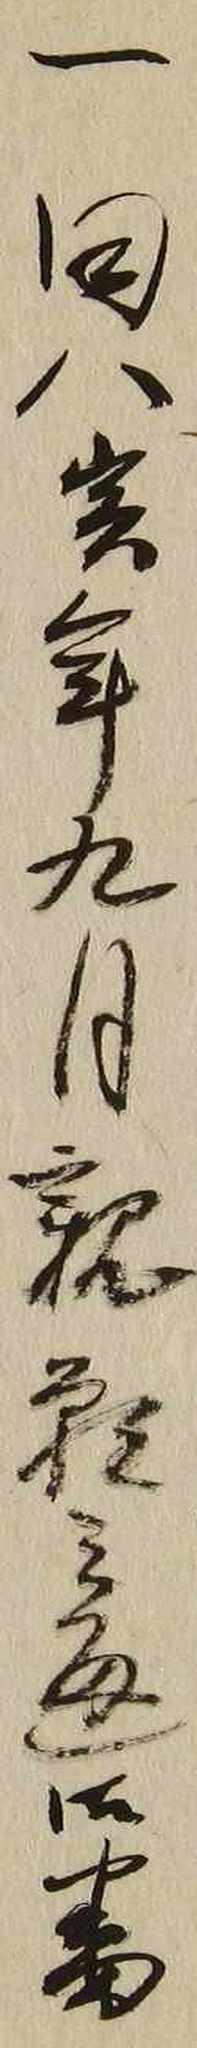一同八寅年九月親願之通御番
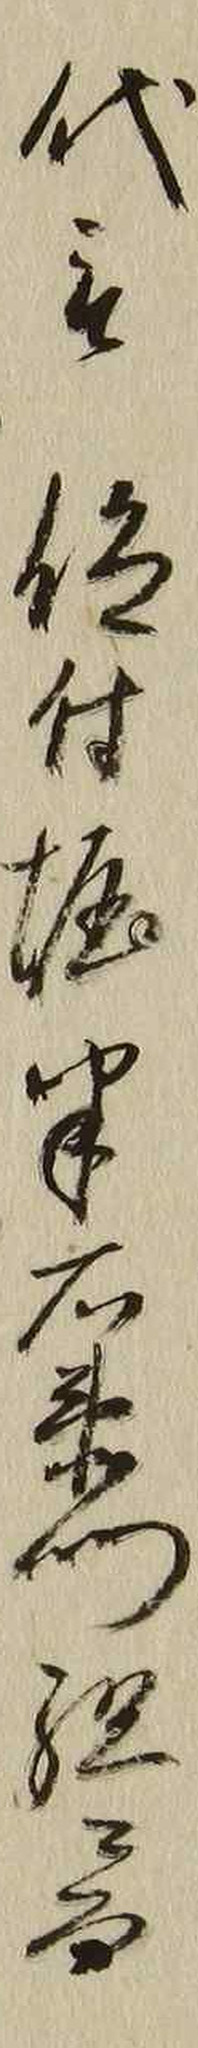代被仰付堀半右衛門組ニ而
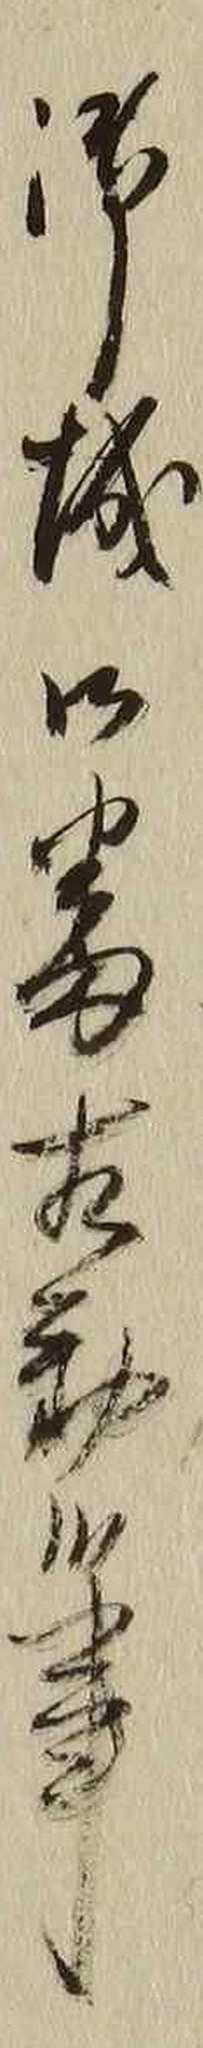御城御番相勤候事
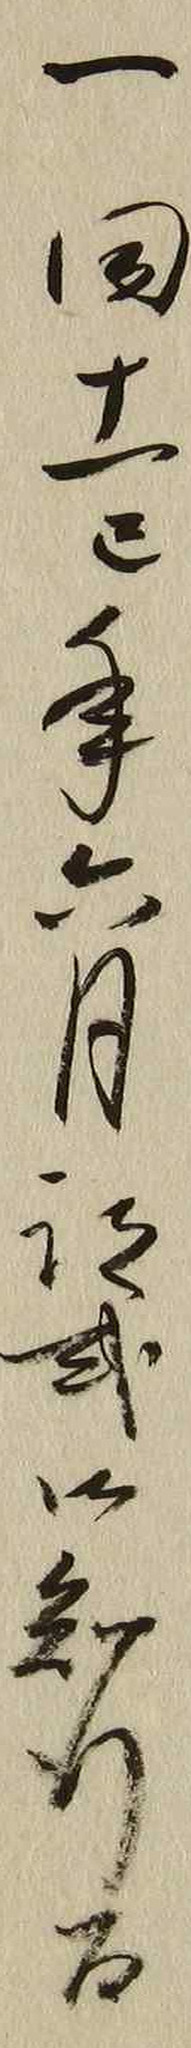一同十一巳年六月跡弐御知行百
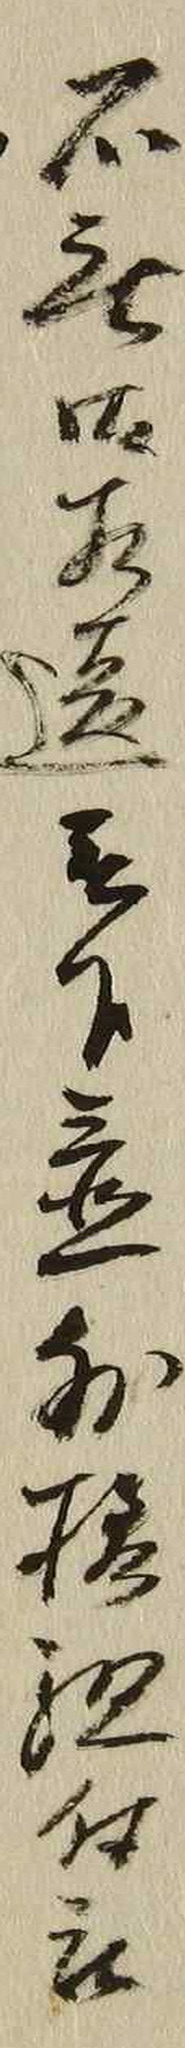石無御相違被下置外様組付被
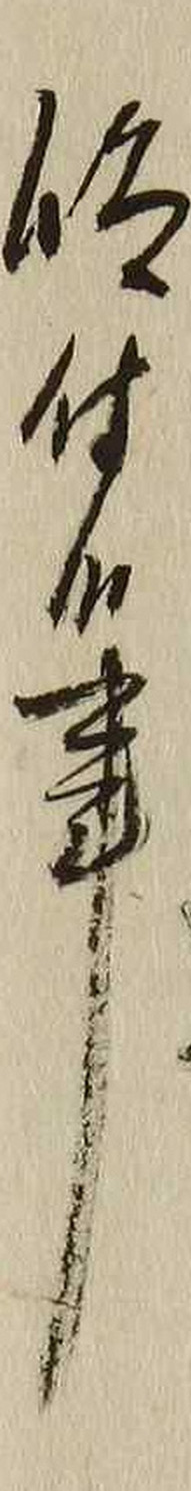仰付候事
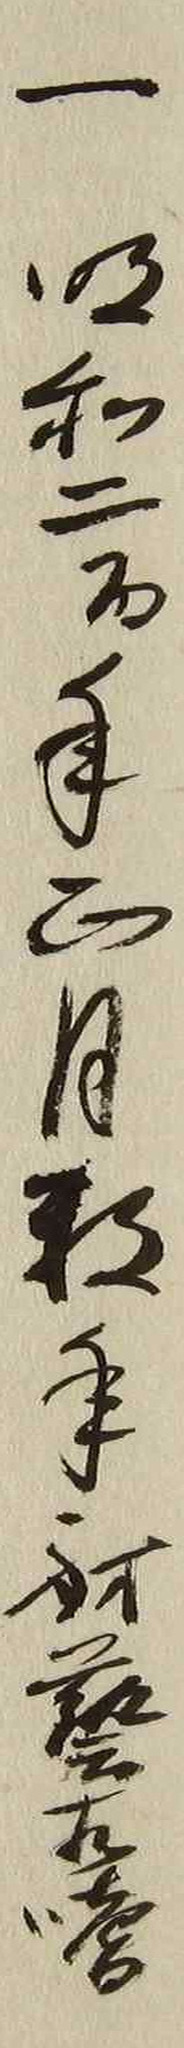一明和二酉年正月数年射芸相嗜
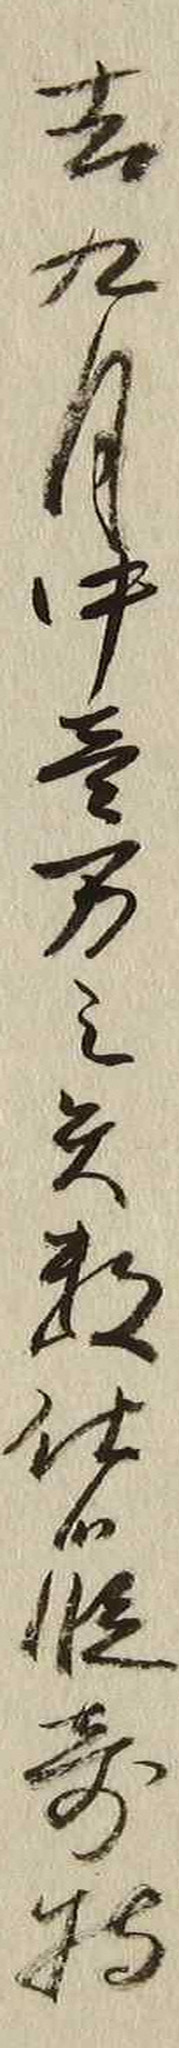去九月中壱万之矢数仕候段奇特
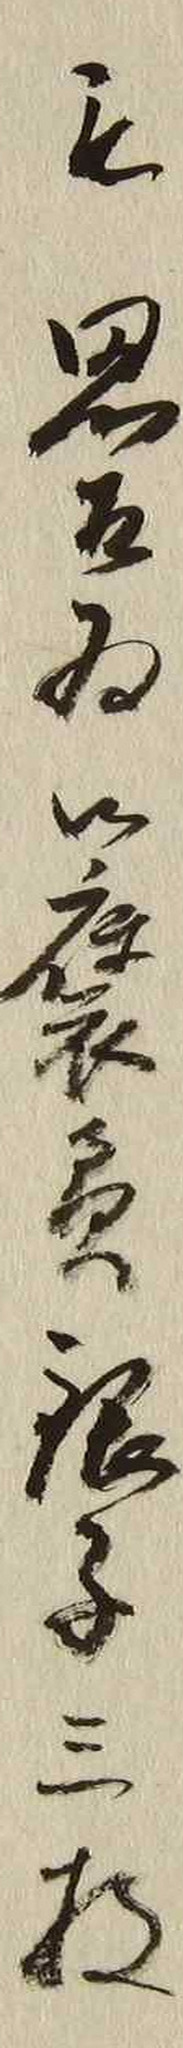被思召為御褒美銀子三枚
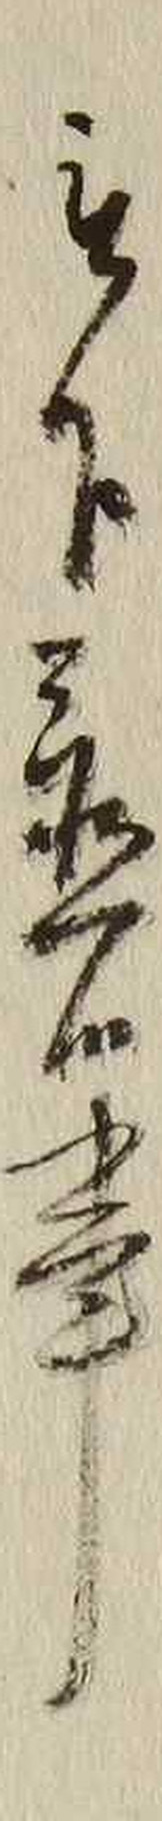被下置候事
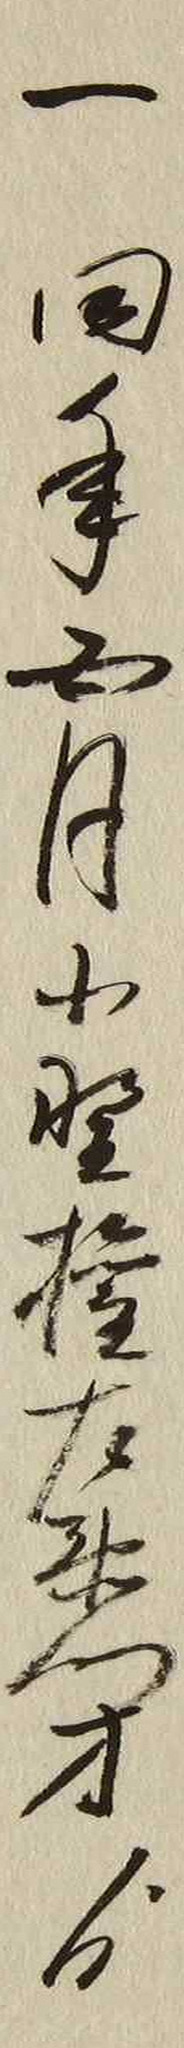一同年五月小野権左衛門方ゟ
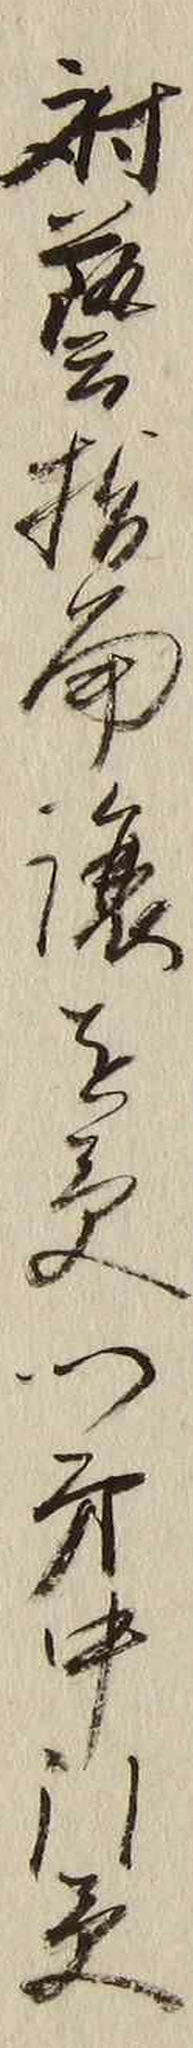射芸指南譲を受門弟中引受
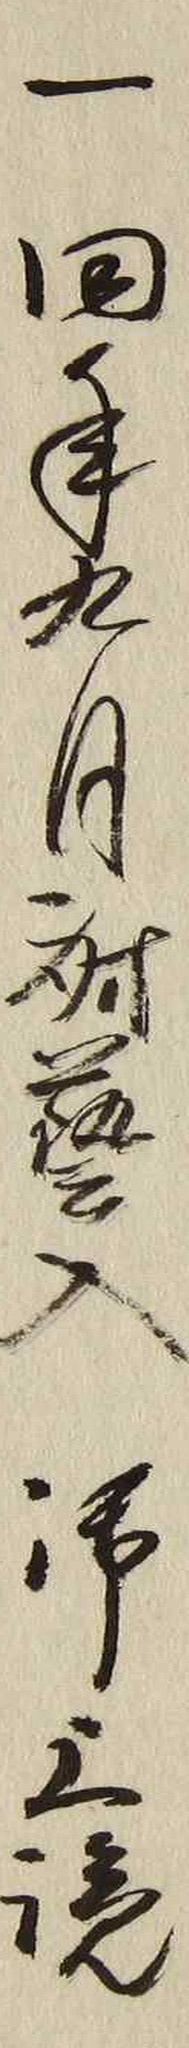一同年九月射芸入御上覧
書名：諸士系譜　巻之346　も之部2
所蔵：会津若松市立会津図書館
